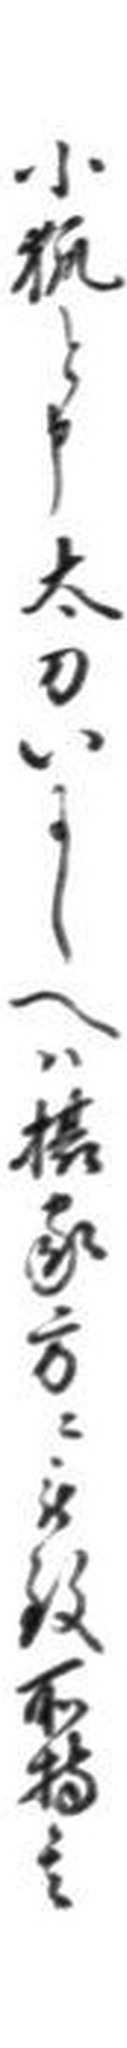小狐と申太刀いにしへハ摂家方ニ被致所持其

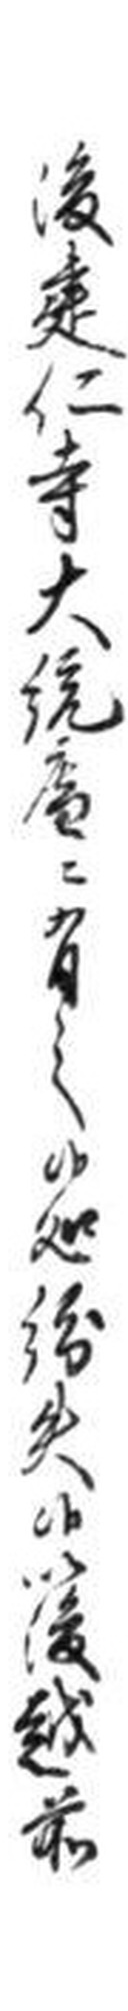後建仁寺大統庵ニ有之候処紛失候以後越前
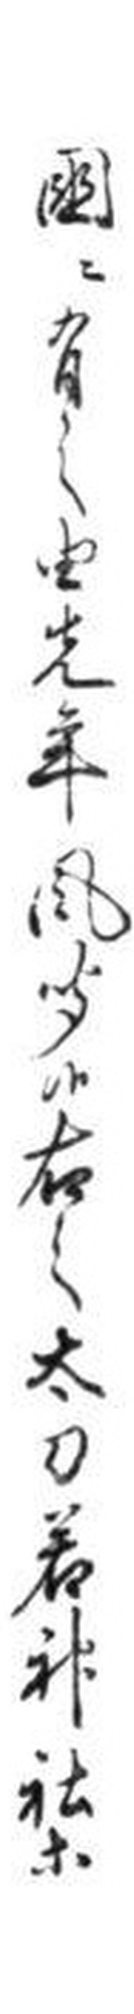国ニ有之由先年風聞候右之太刀若神社等
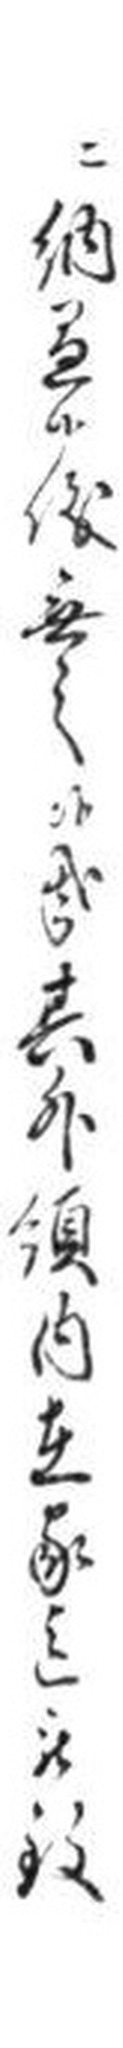納置候儀無之候哉其外領内在家迄被致
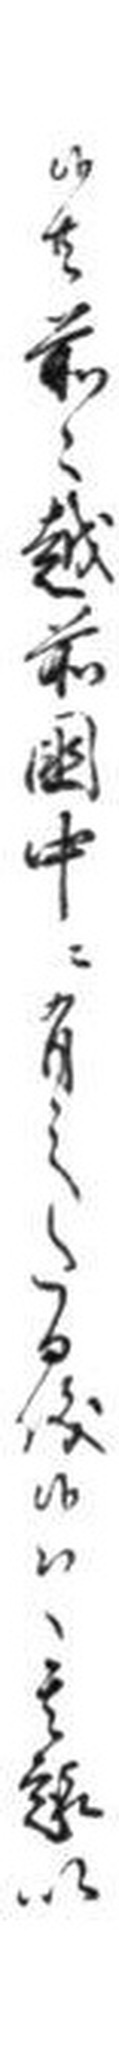候共前々越前国中ニ有之たる儀候八ヽ其趣以
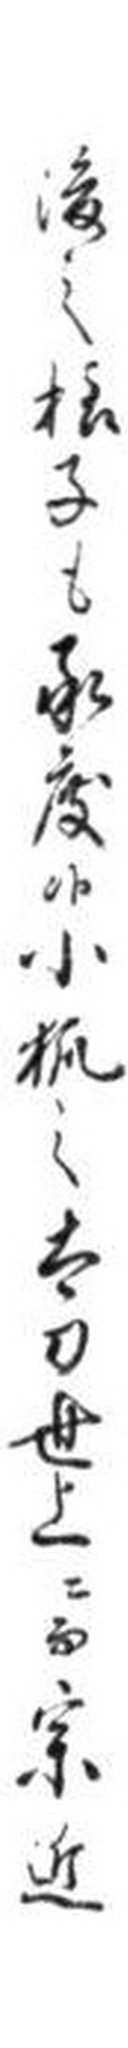後之様子も承度候小狐之太刀世上ニ而宗近
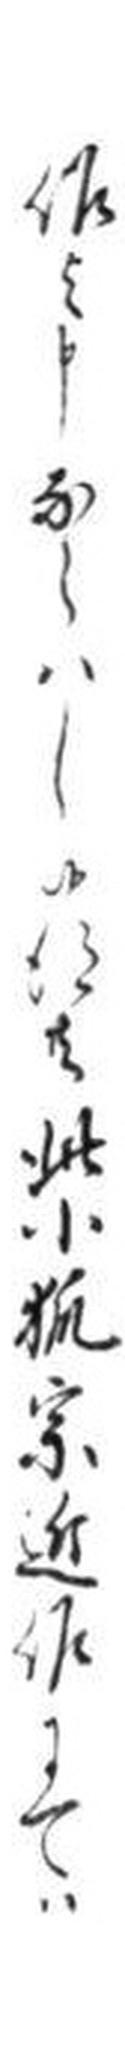作与申ならハし候得共此小狐宗近作にてハ
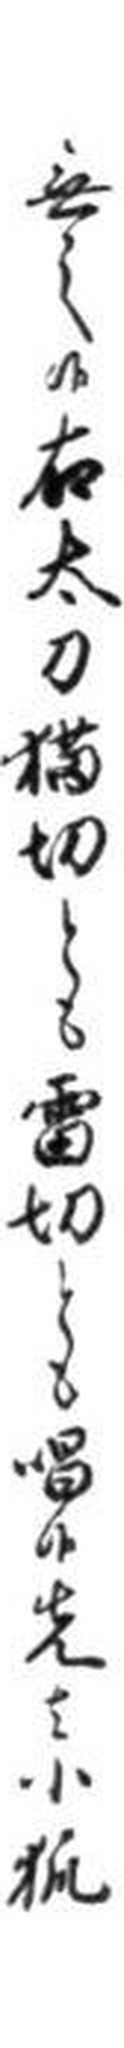無之候右太刀猫切とも雷切とも唱候先者小狐
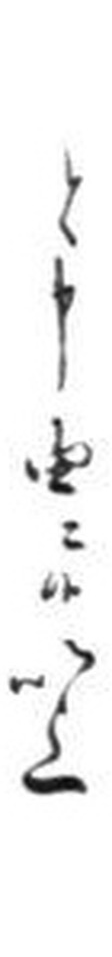と申由ニ候以上
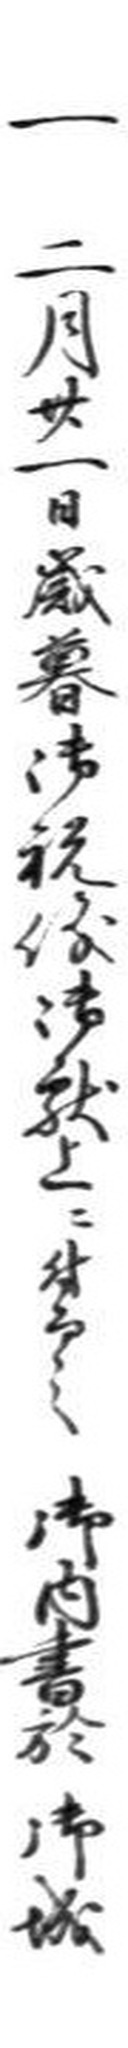一二月廿一日歳暮御祝儀御献上ニ付而之御内書於御城
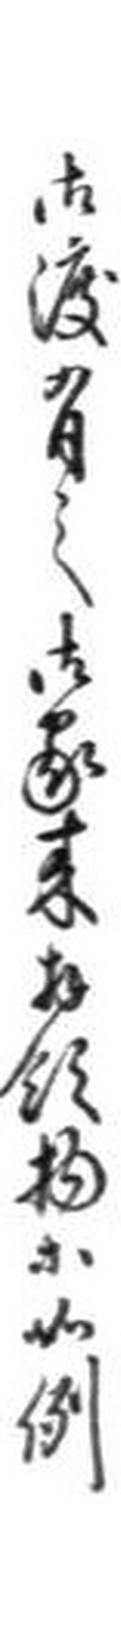御渡有之御家来拝領物等如例
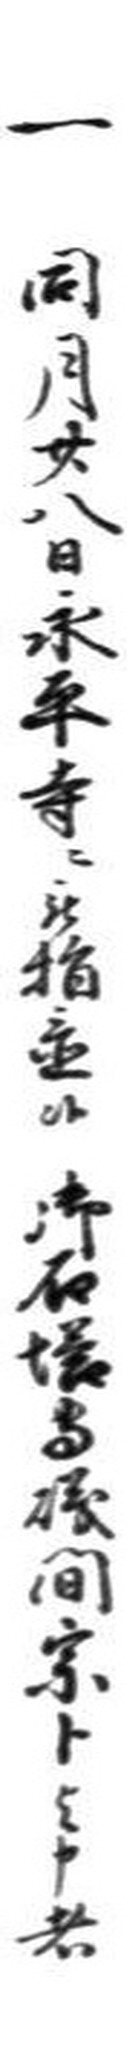一同月廿八日永平寺ニ被指置候御石塔守磯間宗卜与申者
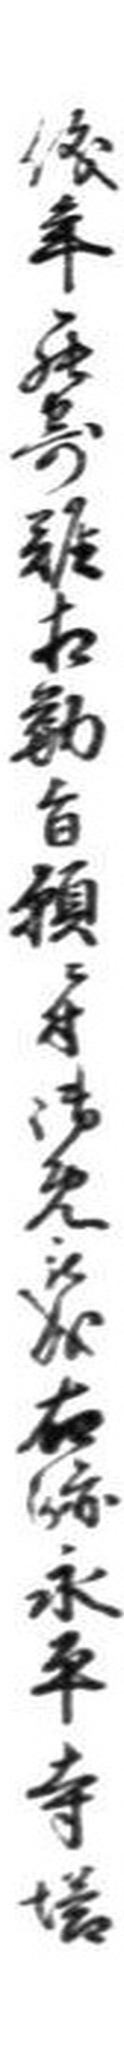儀年罷寄難相勤旨願ニ付御免被成右跡永平寺塔
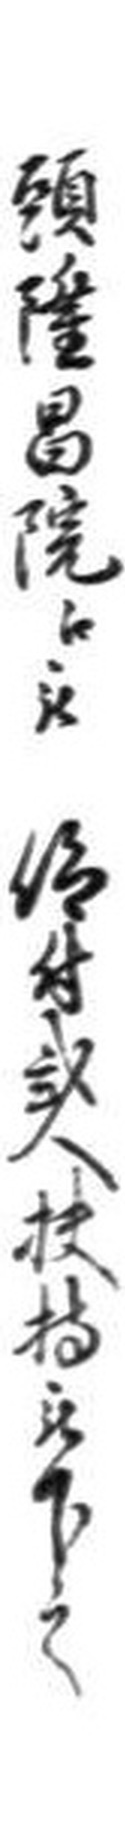頭隆昌院江被仰付弐人扶持被下之
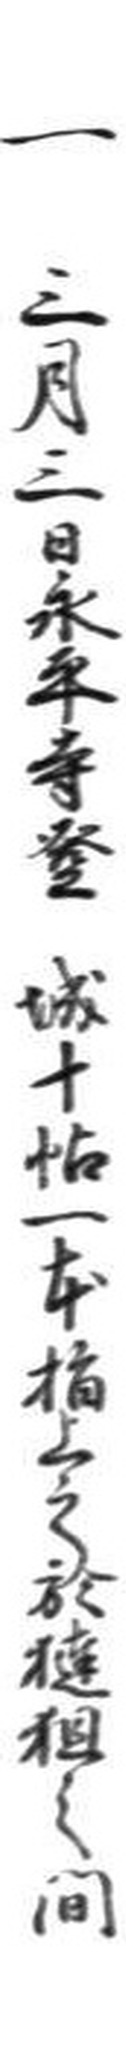一三月三日永平寺登城十帖一本指上之於韃靼之間
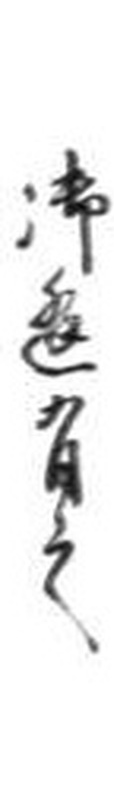御逢有之
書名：家譜 三十四 吉邦公 従享保五年到同六年
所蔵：福井県文書館 Fukui Prefectural Archives
